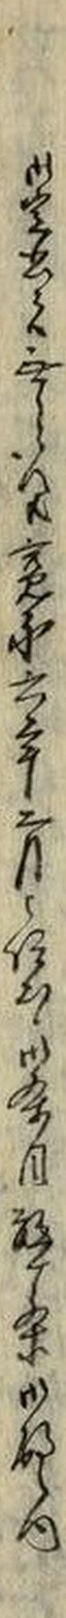御定書ニハ無之候得共寛永六年二月被仰出候御条目数ヶ条御触之内
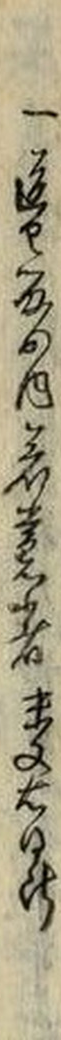一道具留ゟ内若党小者未文右同断
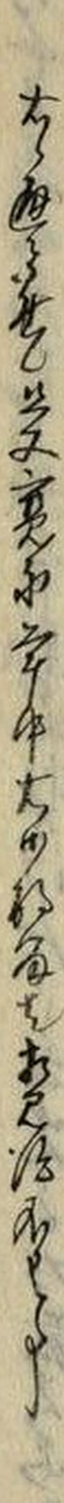右之通ニ御座候且又寛永二年中右触留は相見得不申候事
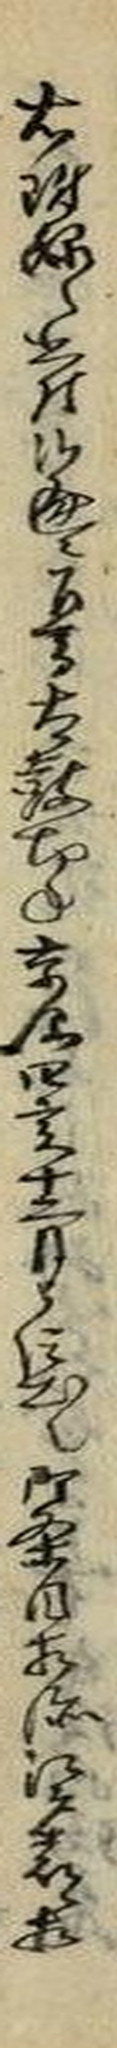右附録之書付弐通ニ下馬太鼓切手享保四亥十二月被仰出之御条目相添江戸表へ相
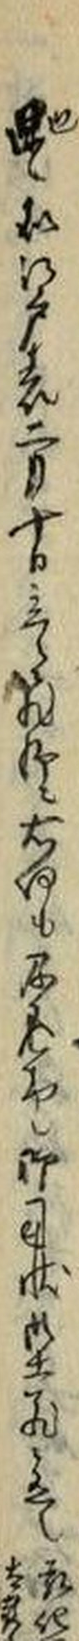廻候処江戸表二月十日立之飛脚ニ右何も及返却候御用状御土蔵ニ有之
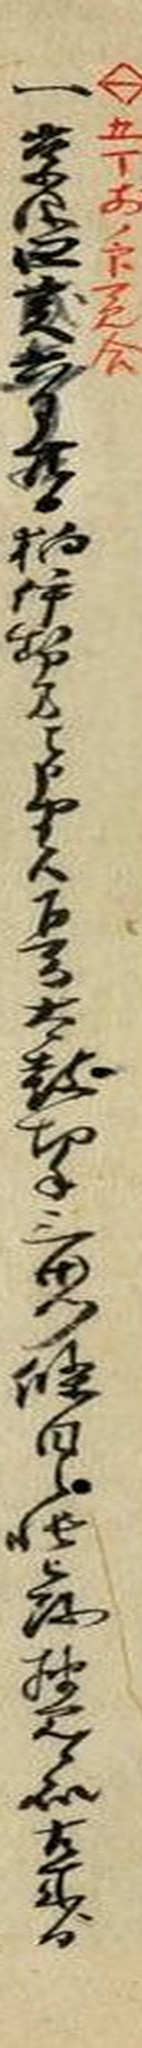一享保四亥六月廿日狛伊勢方被申聞候ハ下馬太鼓切手三御門御條目之帳被致披見候処古来ゟ
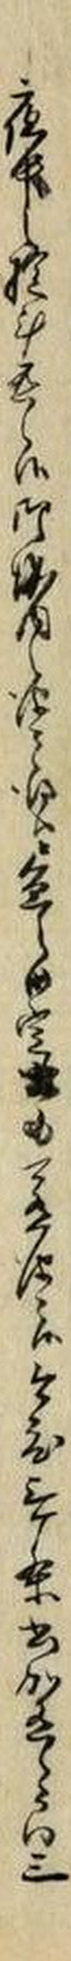夜中之控斗有之候御城内之儀ニ候得ハ昼之御定書も可有候儀ニ候今度三ヶ条書加有之間三
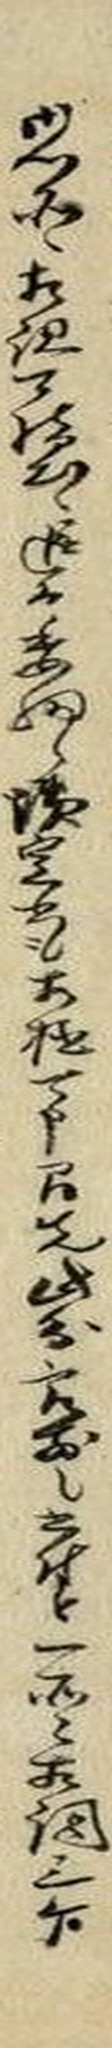御門所へ相認可指出候追而委細之御定書も相極可申間先此分最前之書付と一所ニ相調三ヶ
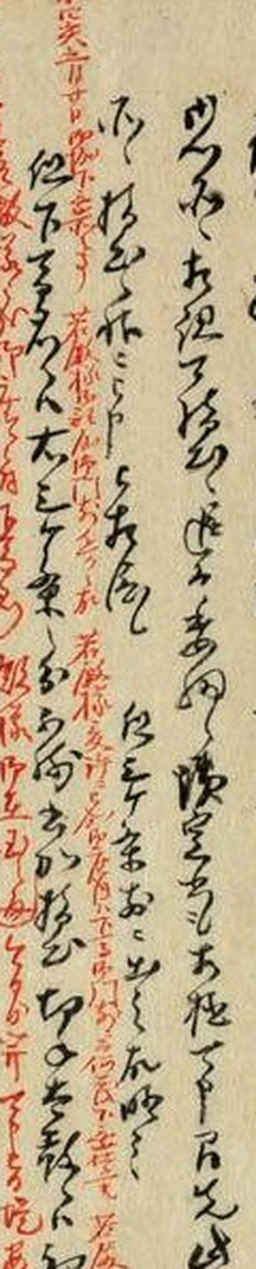所へ指出候様ニ被申被相渡候但三ヶ条前ニ出之故略之
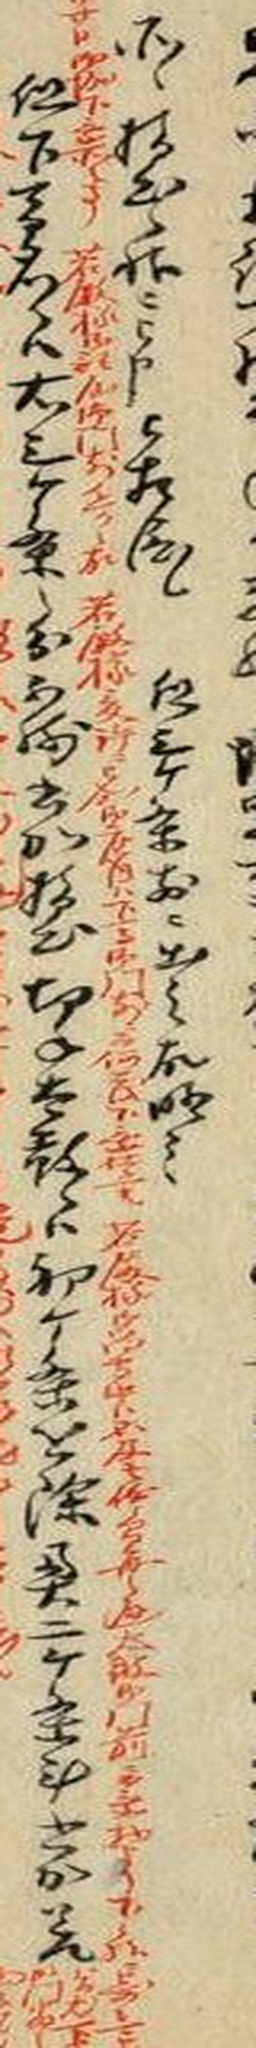但下馬御門へハ右三ヶ条之分不残書加切手太鼓へハ初ヶ条を除奥二ヶ条斗書加差
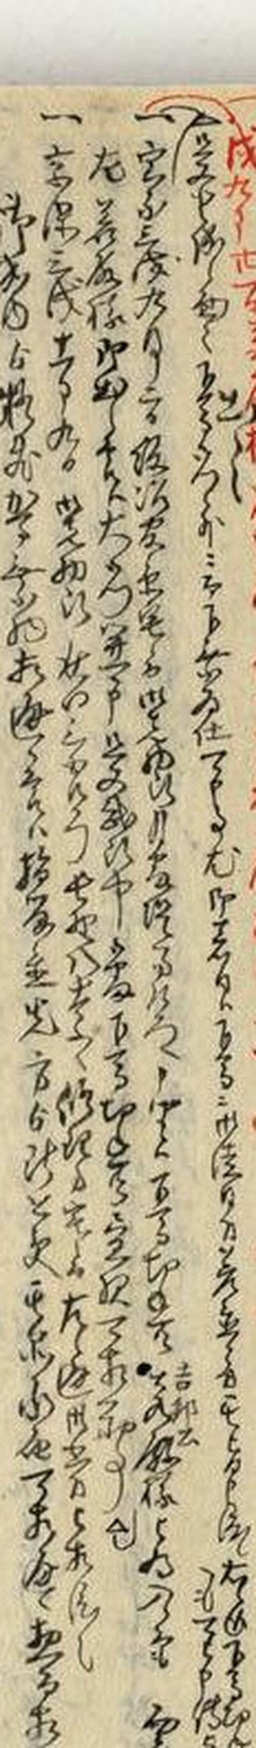尤若殿様御出之節ハ大御門開可申且又武頭中御番下馬切手共昼夜可相勤事▽
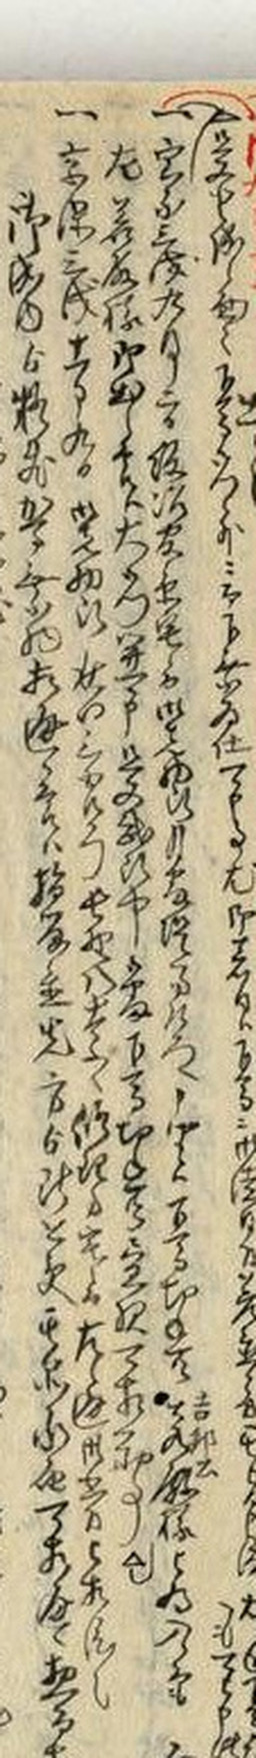尤若殿様御出之節ハ大御門開可申且又武頭中御番下馬切手共昼夜可相勤事▽
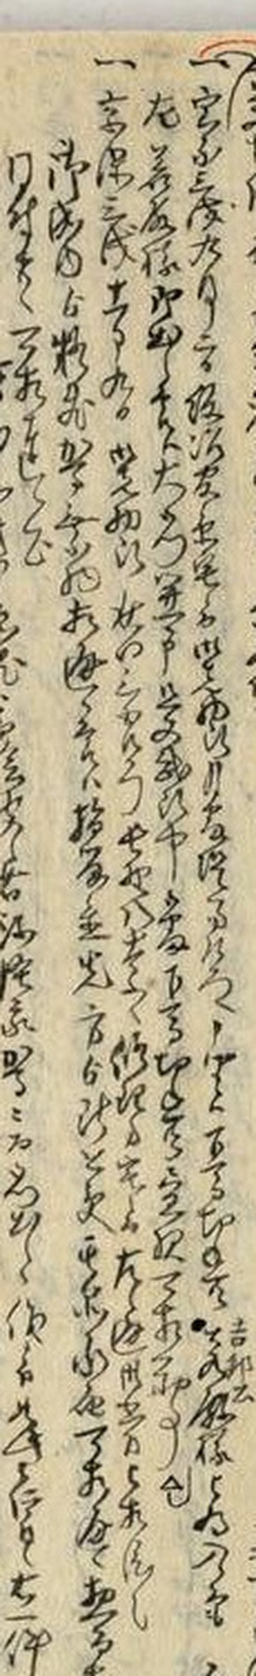一享保三戌十一月九日御先物頭秋田三五左衛門長野八太夫へ修理方宅ニ而左之通御書付被相渡之
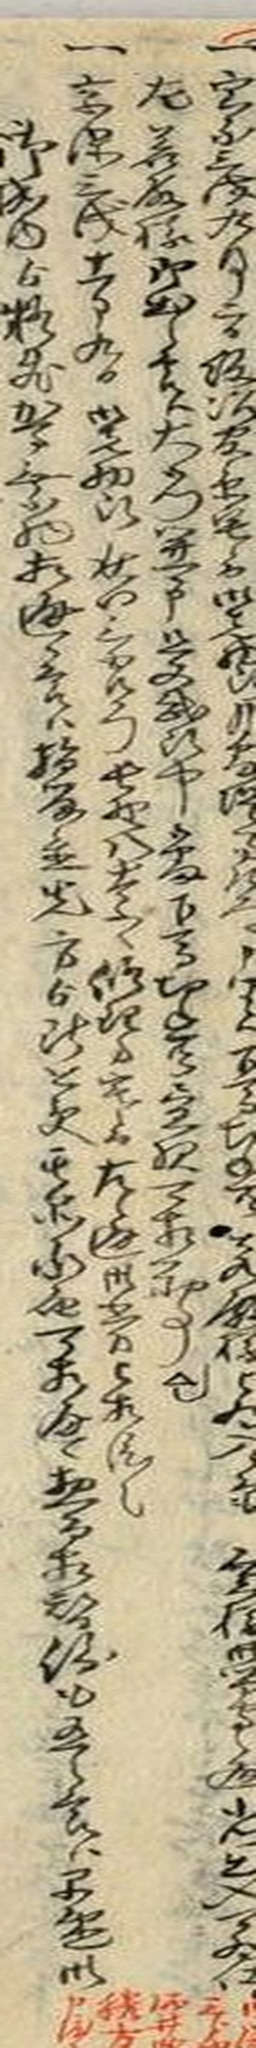御城内ゟ紛敷駕乗物相通候節ハ指留置先方ゟ断を受其品承届可相通候惣而相替候儀も有之節ハ早速御
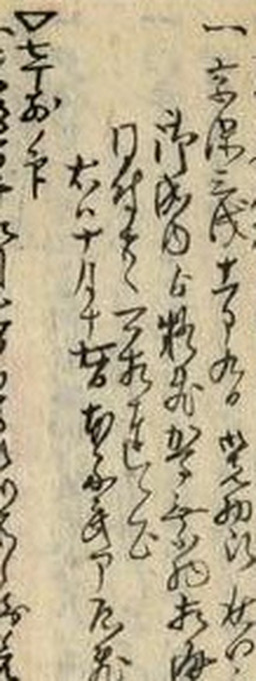目付共へ可相達候以上
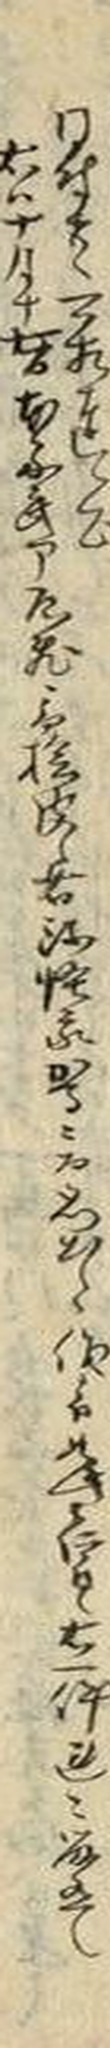右ハ十月十七日本多民部屋敷ニ而檜皮之者致怪我駕ニ而御門出候儀ニ付如此被仰付候右一件連々留有之
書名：御門御櫓之部
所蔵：福井県文書館 Fukui Prefectural Archives
